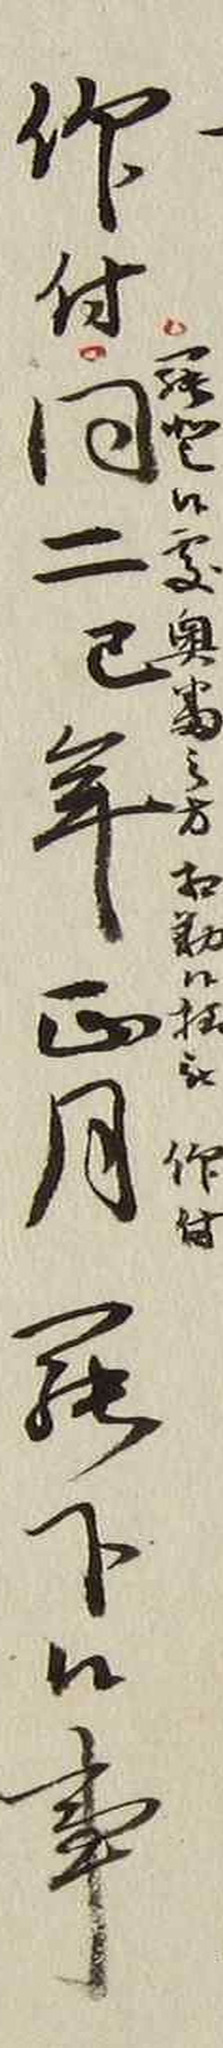仰付同二巳年正月罷下候事
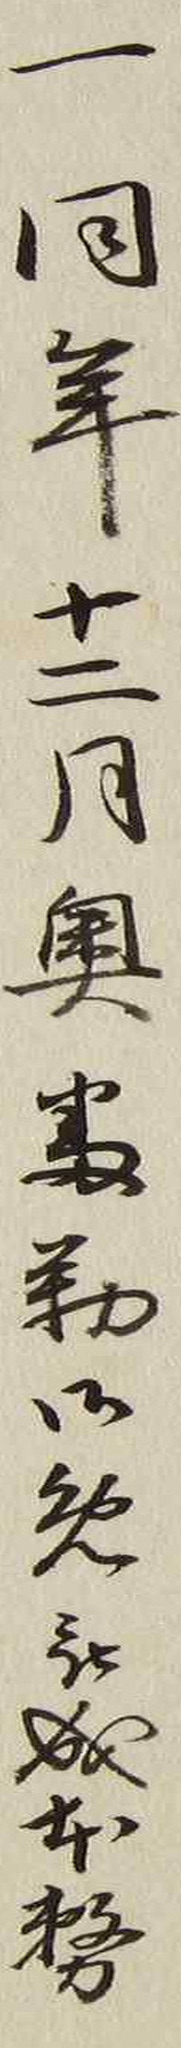一同年十二月奥番勤御免被成本務
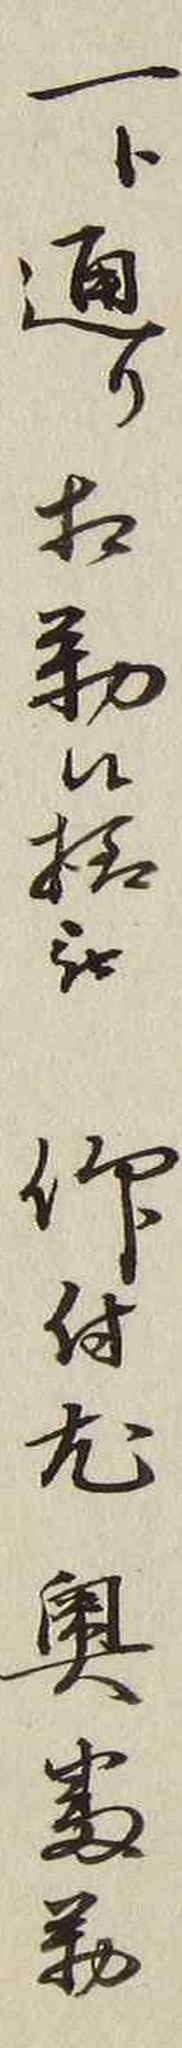一ト通り相勤候様被仰付尤奥番勤
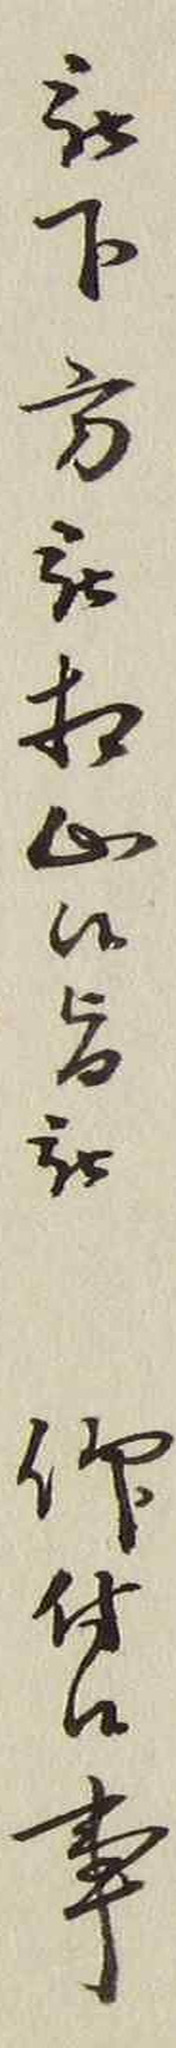被下方被相止候旨被仰付候事

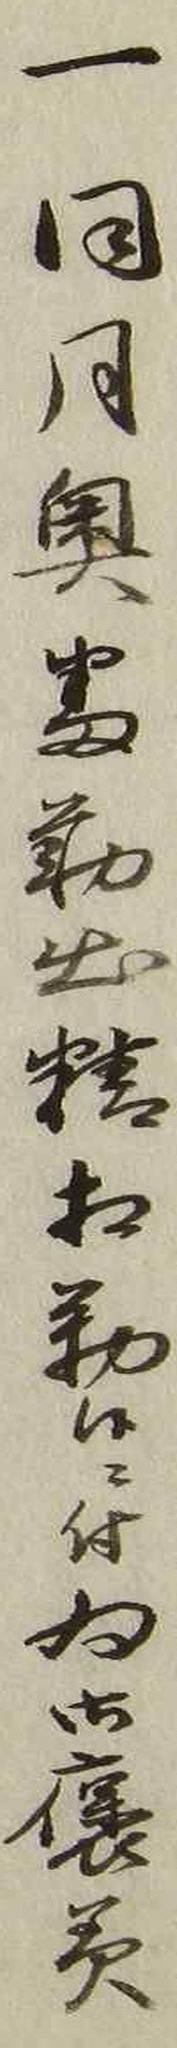一同月奥番勤出精相勤候ニ付為御褒美
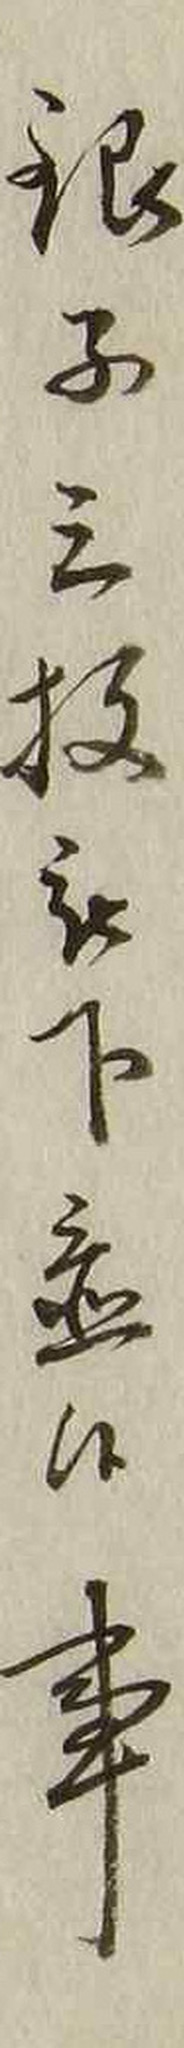銀子三枚被下置候事
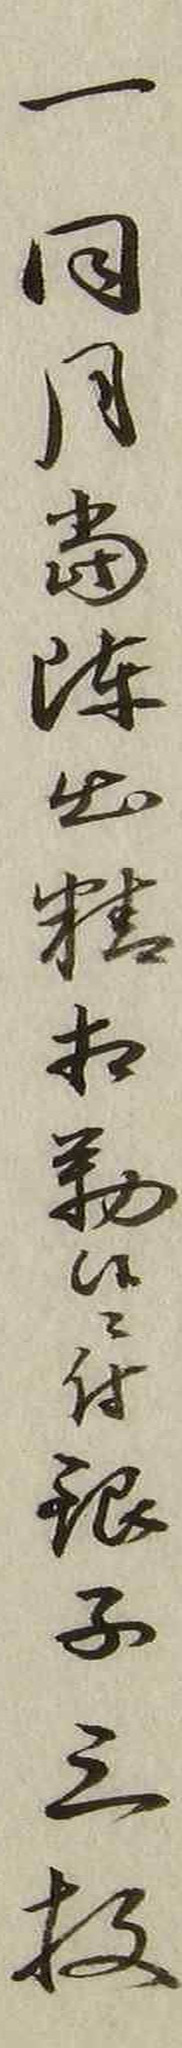一同月当陣出精相勤候ニ付銀子三枚
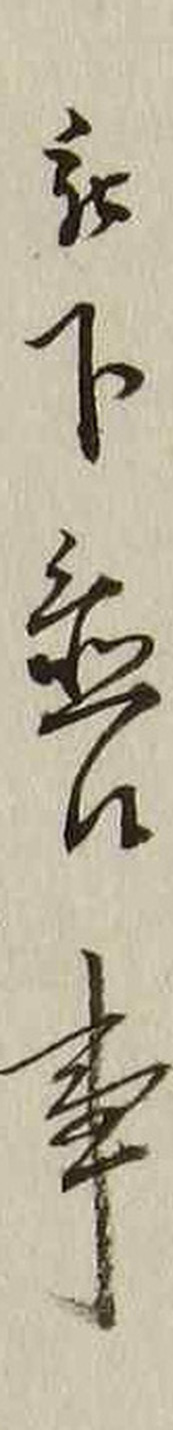被下置候事
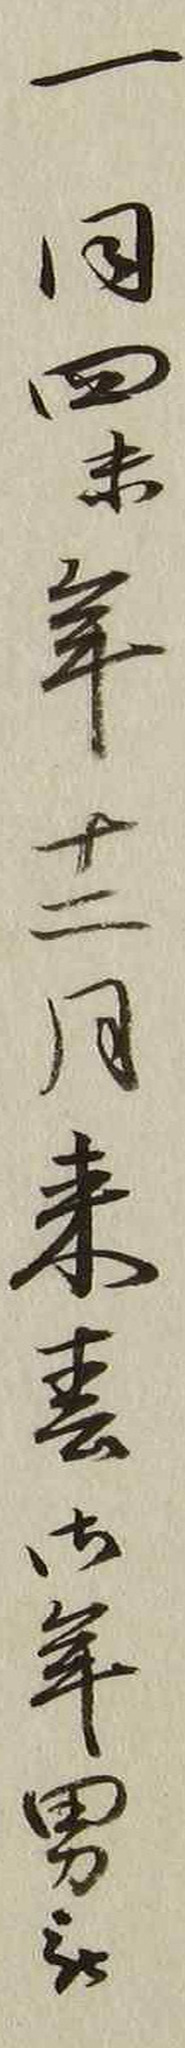一同四未年十二月来春御年男被
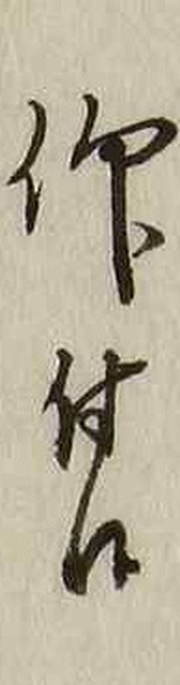仰付候
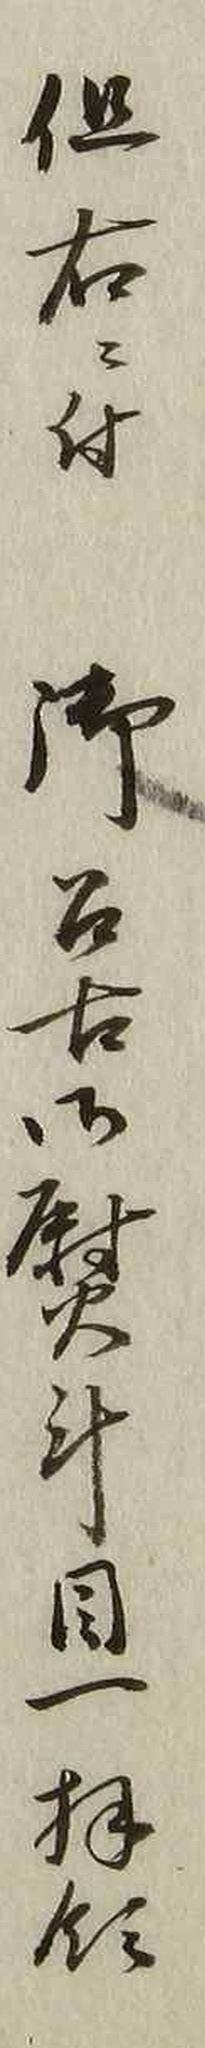但右ニ付御召古御熨斗目一拝領
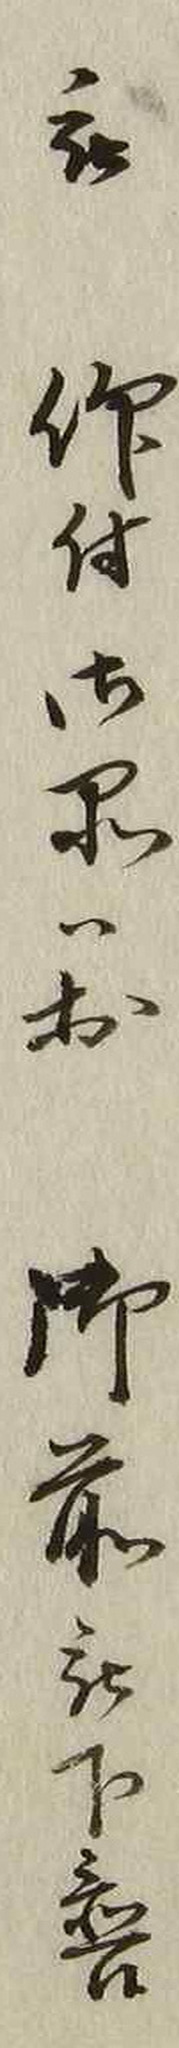被仰付御品は於御前被下置候
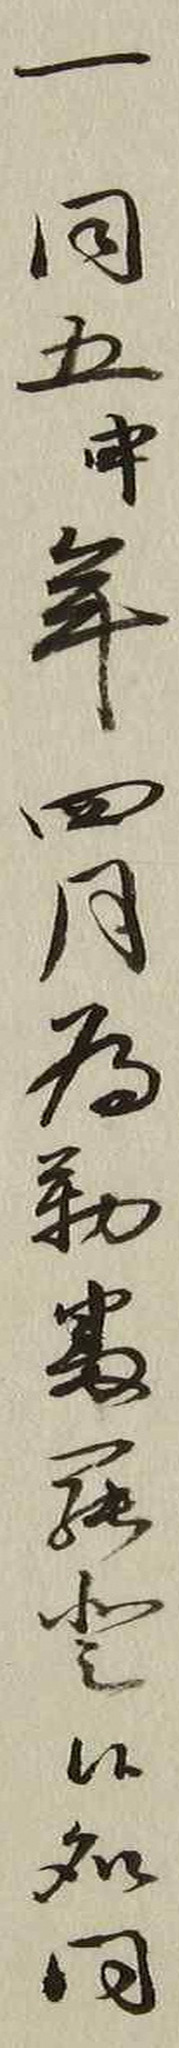一同五申年四月為勤番罷登候処同
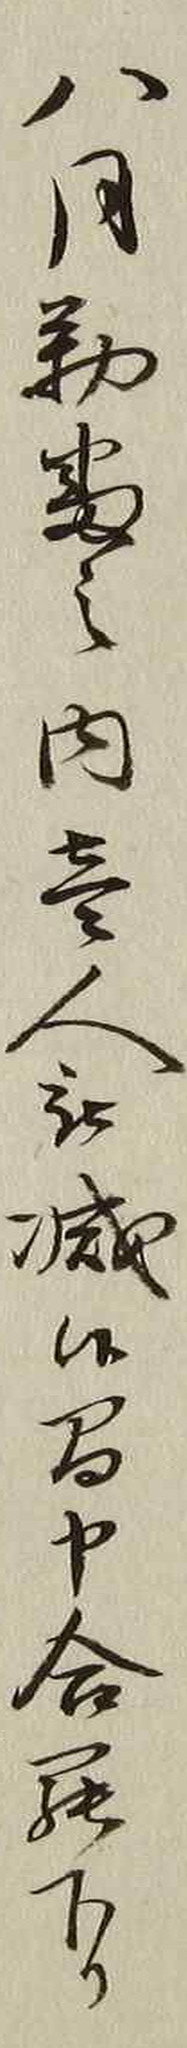八月勤番之内壱人被減候間申合罷下り
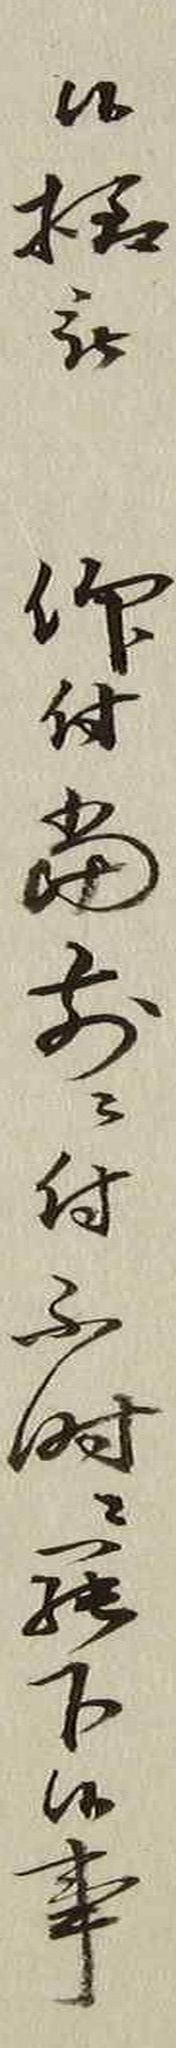候様被仰付当前ニ付不時ニ罷下候事
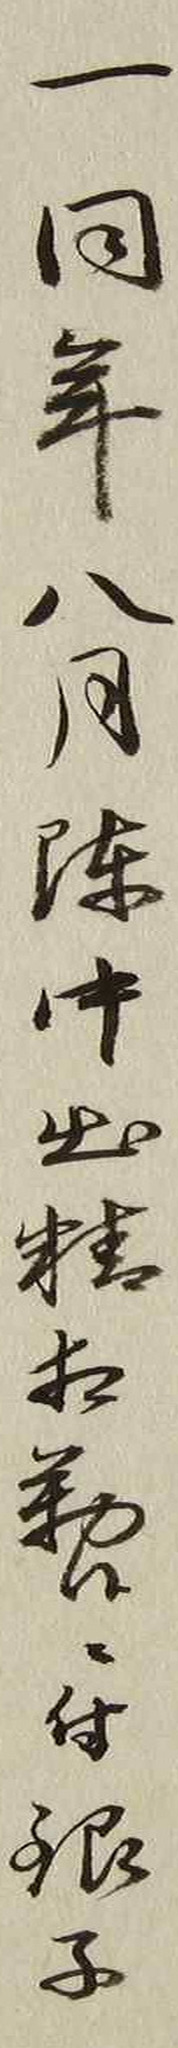一同年八月陣中出精相勤候ニ付銀子
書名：諸士系譜　巻之160　な之部2
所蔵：会津若松市立会津図書館
